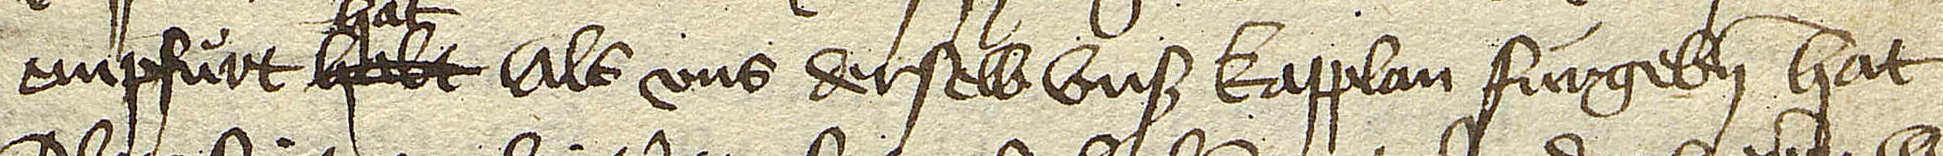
empfürt habt / als vns derſelb vnſ* kapplan fürgebn* hat
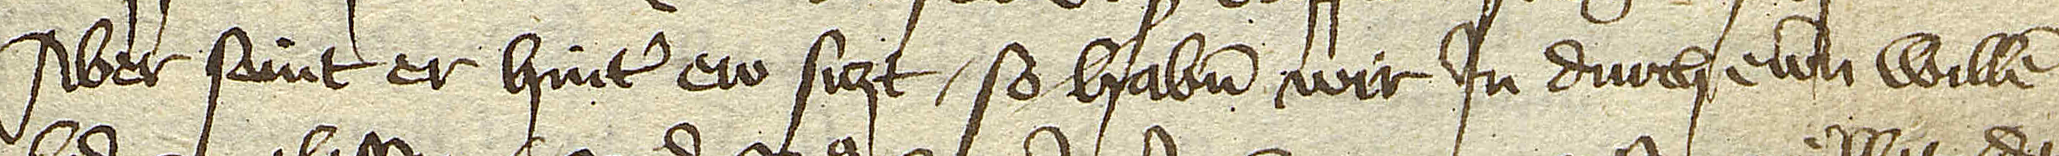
Aber ſeint er hint* ew ſicʒt / ſo habn* wir In durch ew*n wille*
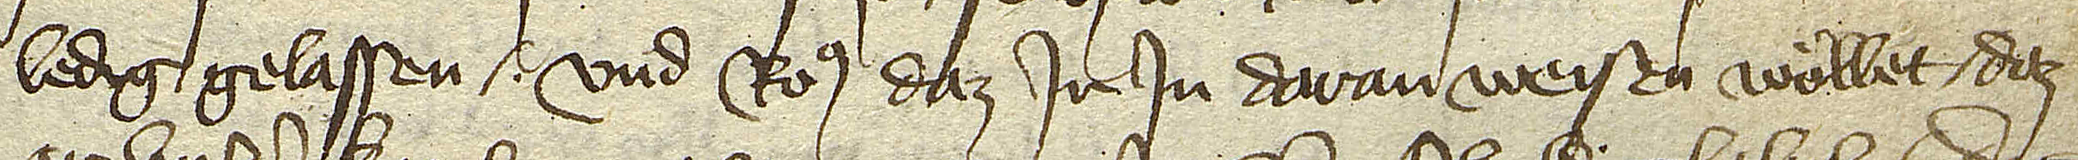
ledig gelaſſen / . vnd Ro* daʒ Ir In daran weiſen wöllet / daʒ
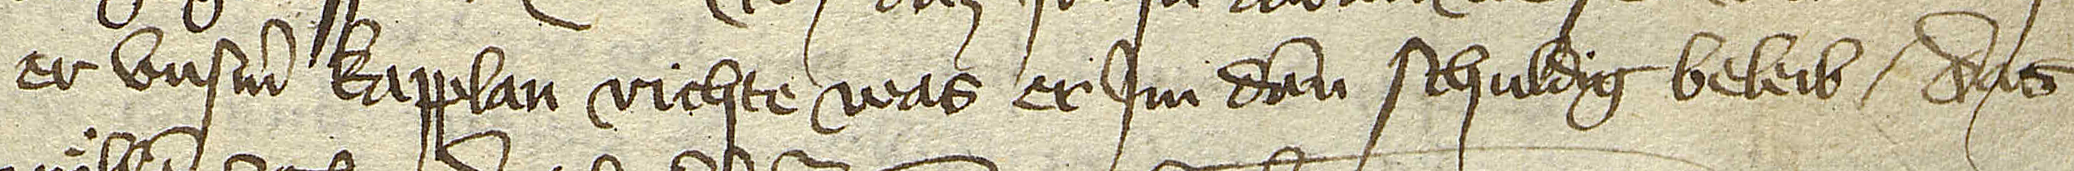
er vnſm* Kapplan richte was er Im dan* ſchuldig beleib / Das
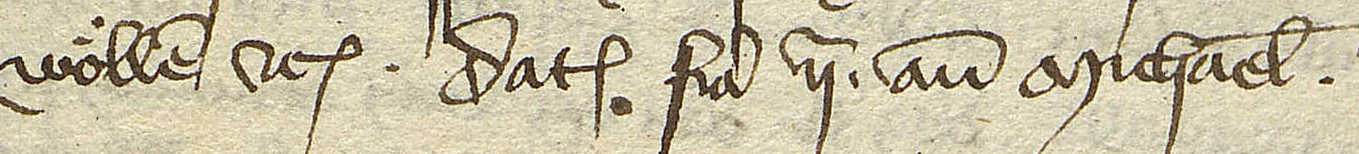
wölle* ec* . Dat* fia* ii* . an* Michael* .
